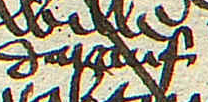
darauf
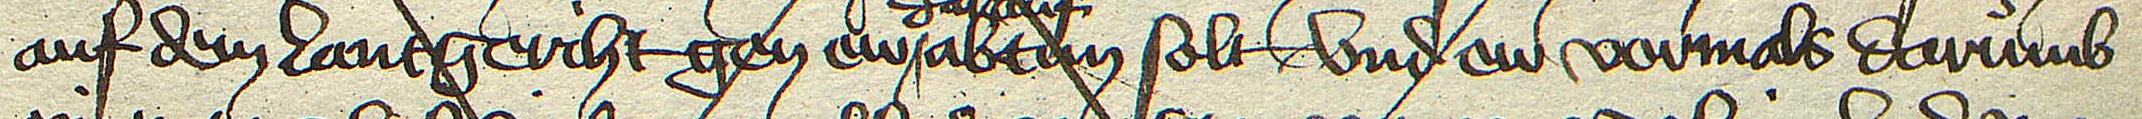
auf dem Lantgeriht gen ew abtun ſolt / vnd ew vormals darümb
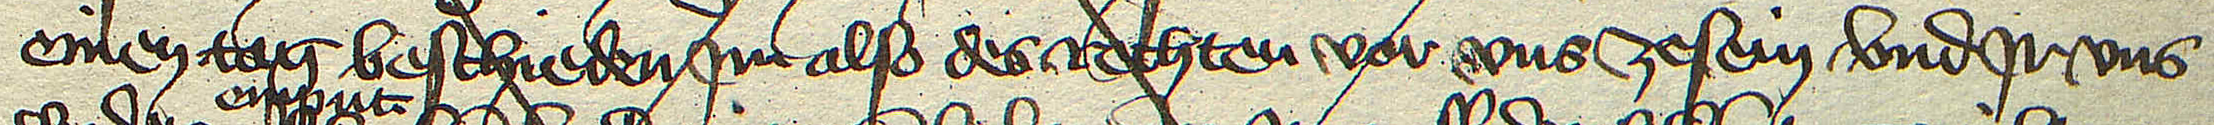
einen tag beſchieden Im alſo ds rechten vor vns cʒeſein / vnd Ir vns
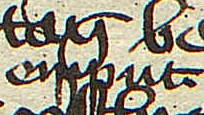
emput
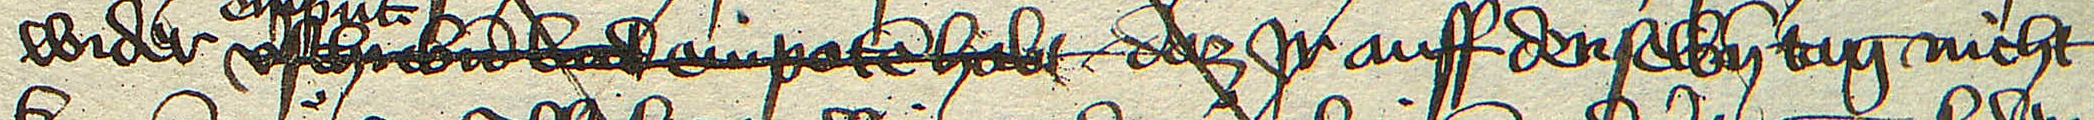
wider v*ſchribn* vnd empote* habt / daʒ Ir auff denſelbn* tag nicht
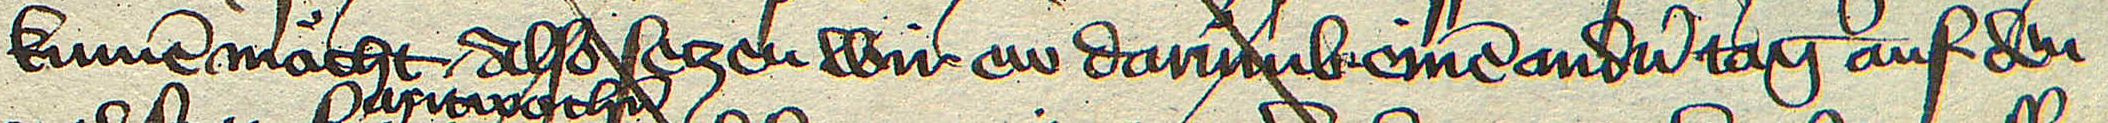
kume* möcht / Alſo ſecʒen wir ew darümb eine* andn* tag auf den
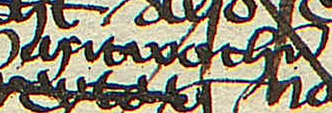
Mitwochn*
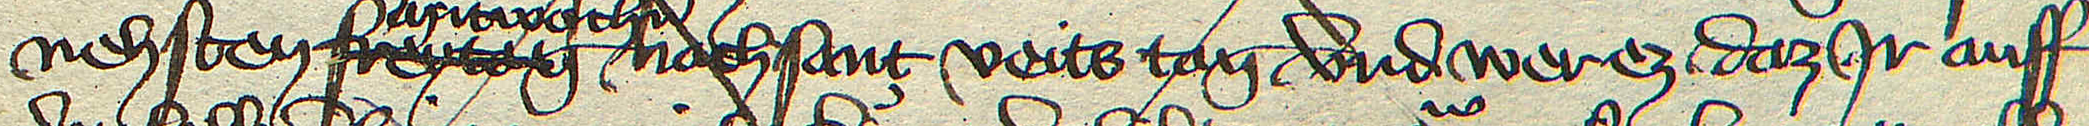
nehſten freytag nach ſant veits tag / vnd wer eʒ / daʒ Ir auff
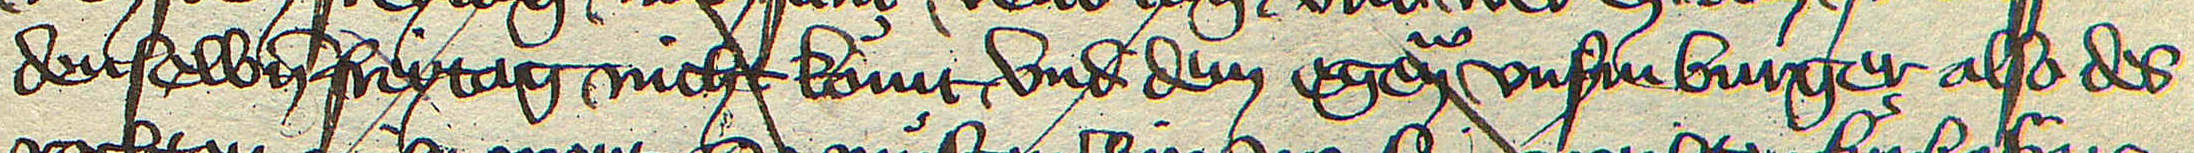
denſelbn* freytag nicht kömt / vnd dem egen* vnſ*m burger alſo des
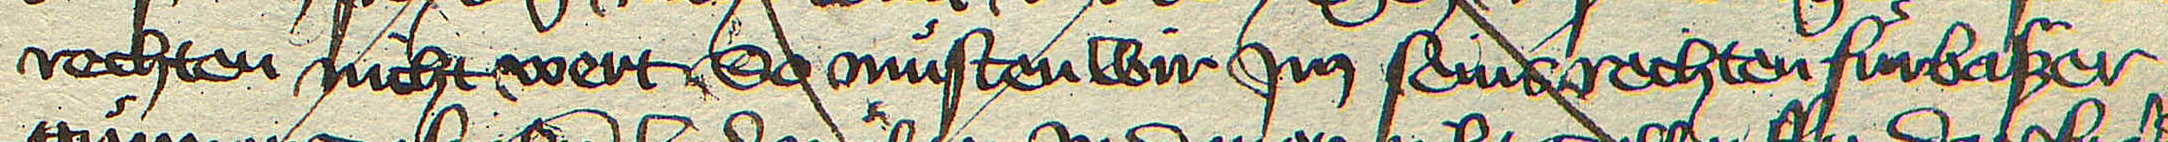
rechten nicht wert / So müſten wir Im ſeins rechten fürbaſʒer
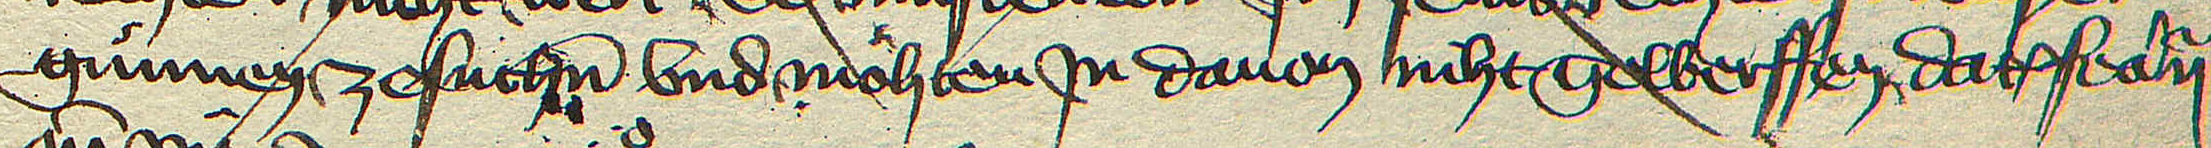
günnen cʒeſuchn* vnd möhten In dauon niht gewerffen / dat* fea* ii*
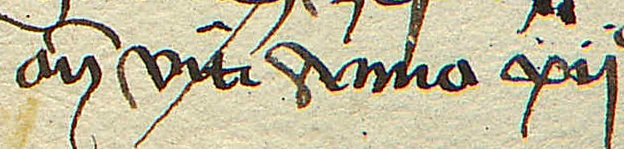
an* viti Anno xii*
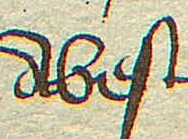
Abeſt
